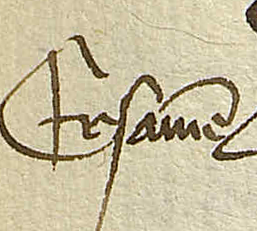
Erſame*
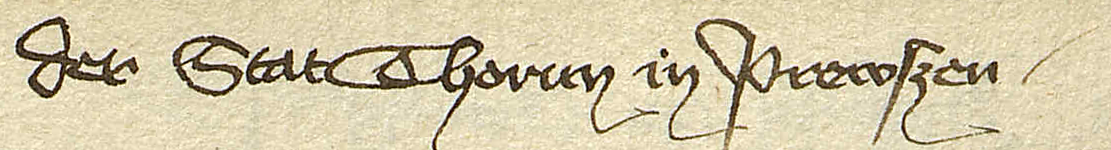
der Stat Thorun in Prewſʒen /
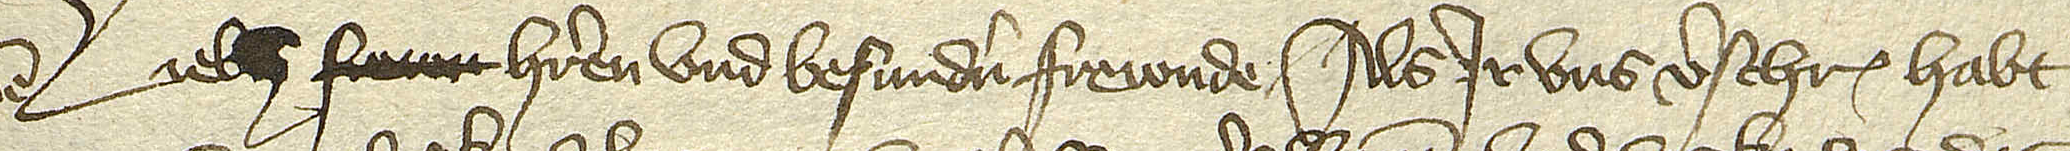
Liebn* frewn hr*en vnd befundn* frewnde / Als Ir vns v*ſchr* habt
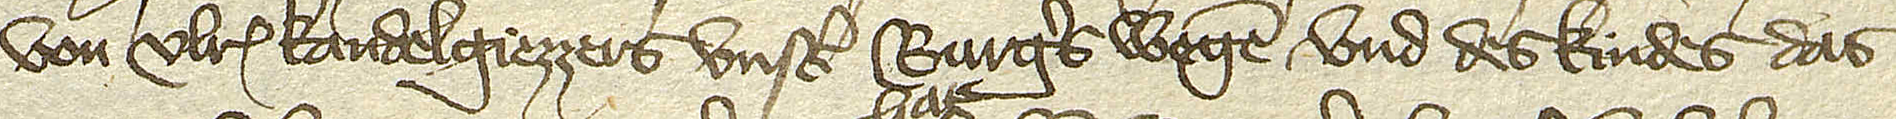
von vlr* kandelgieʒʒers vnſ*s Burg*s wege* / vnd des kindes das
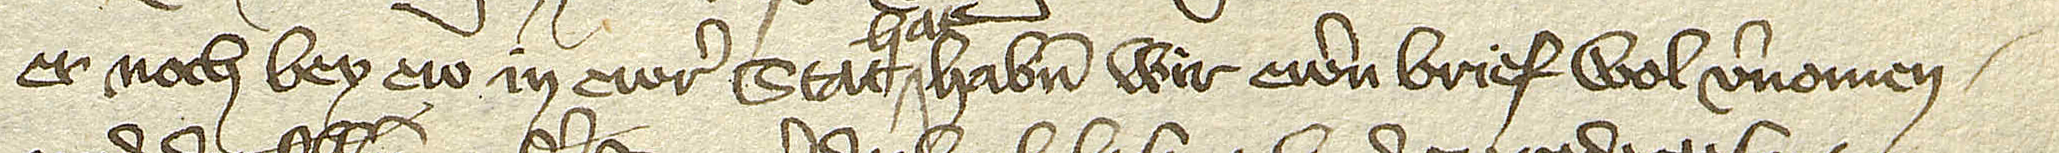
er noch bey ew in ewr* Stat habn* wir ew*n brief wol v*nomen /
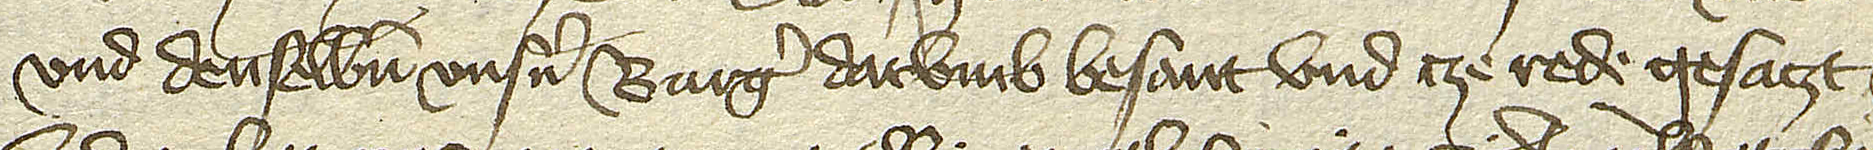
vnd denſelbn* vnſn* Burg* darvmb beſant vnd cʒe rede geſacʒt
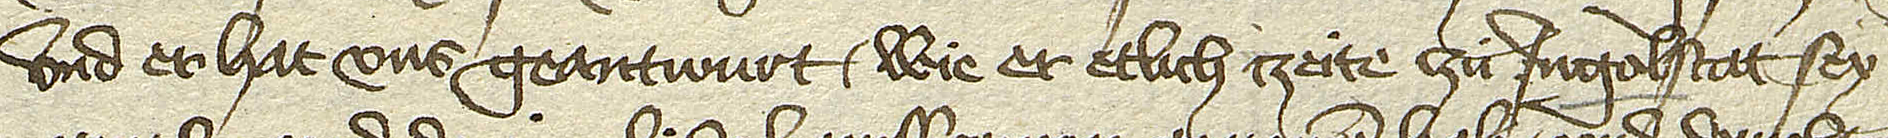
vnd er hat vns geantwurt / wie er etlich cʒeite cʒu Ingolſtat ſey
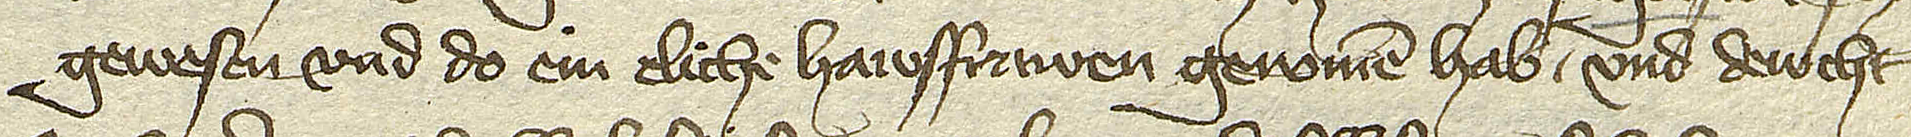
geweſen vnd do ein eliche hawſfrawen genome* hab / vnd dewcht
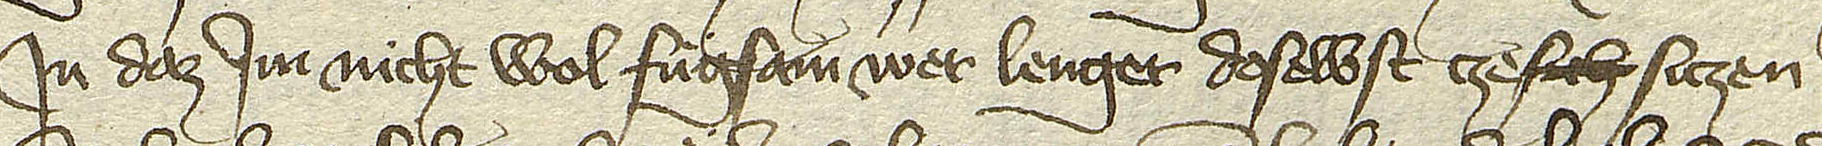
In daʒ Im nicht wol fügſam wer lenger doſelbſt cʒeſich ſicʒen
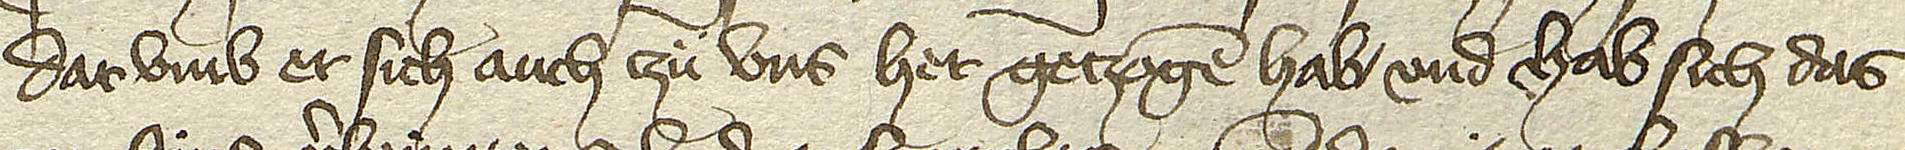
darvmb er ſich auch cʒü vns her gecʒoge* hab / vnd hab ſich das
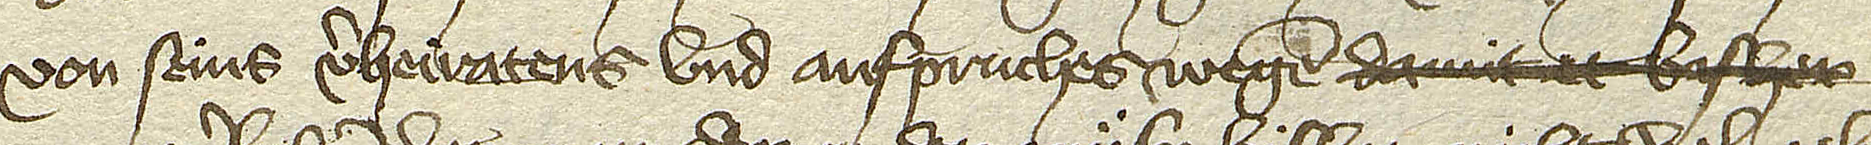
von ſeins v*heiratens vnd aufpruches wege* damit er biſher
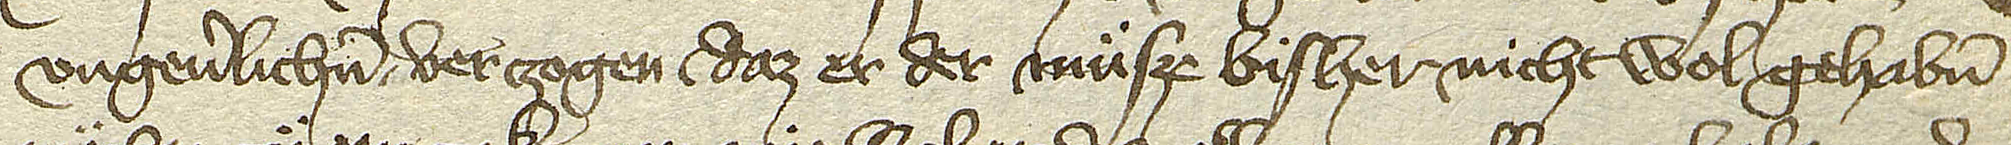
vngeu*lichn* / vercʒogen / daʒ er der müſʒe biſher nicht wol gehabn*
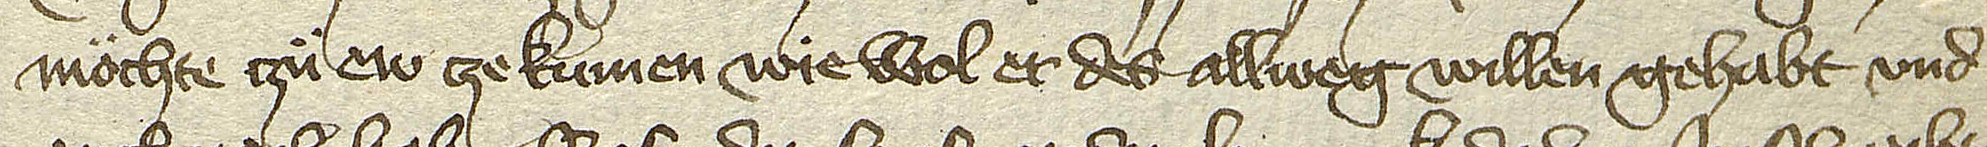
möchte cʒü ew cʒe kumen wie wol er des allweg willen gehabt vnd
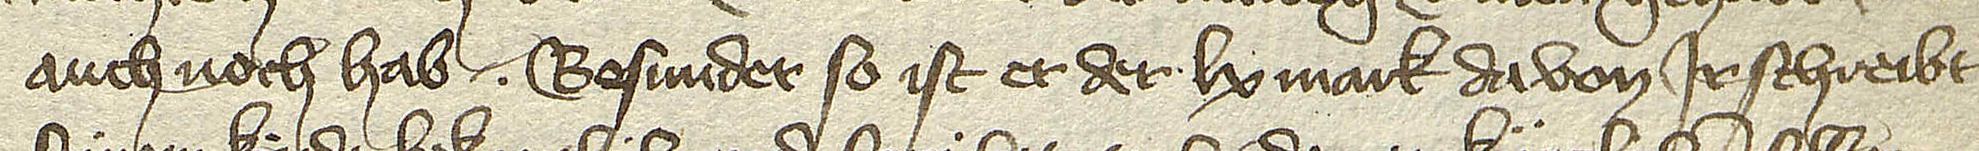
auch noch hab / . Beſunder ſo iſt er der lx mark davon Ir ſchreibt
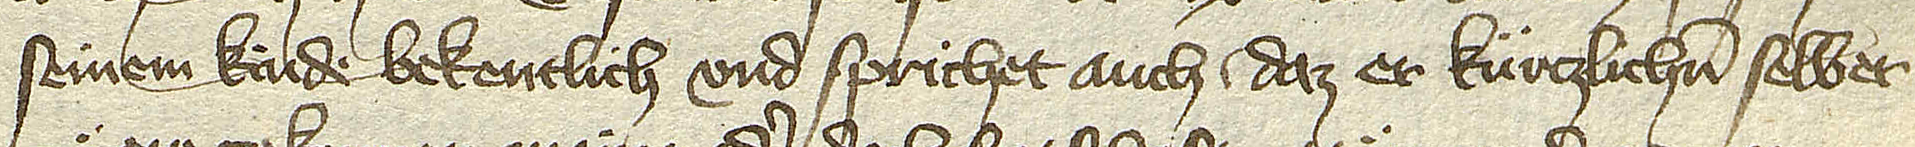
ſeinem kinde bekentlich vnd ſprichet auch / daʒ er kürcʒlichn* ſelber
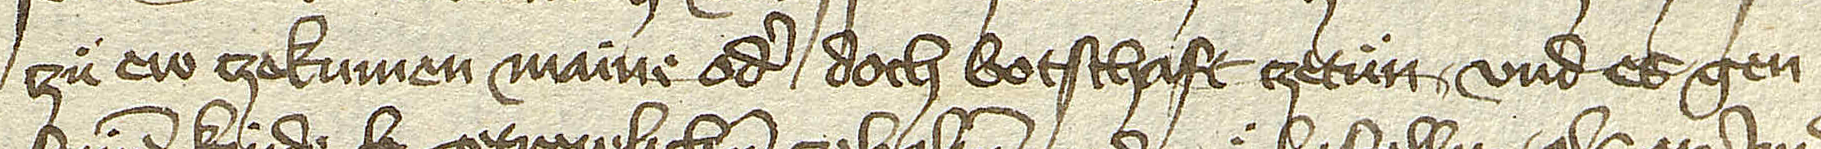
cʒü ew cʒekumen maine od* doch botſchaft cʒetün / vnd es gen
